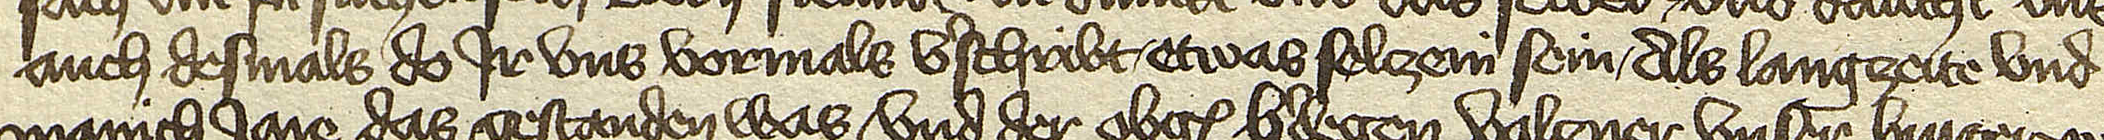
auch deſmals do Ir vns vormals v*ſchribt / etwas ſelcʒein ſein / Als langcʒeite vnd
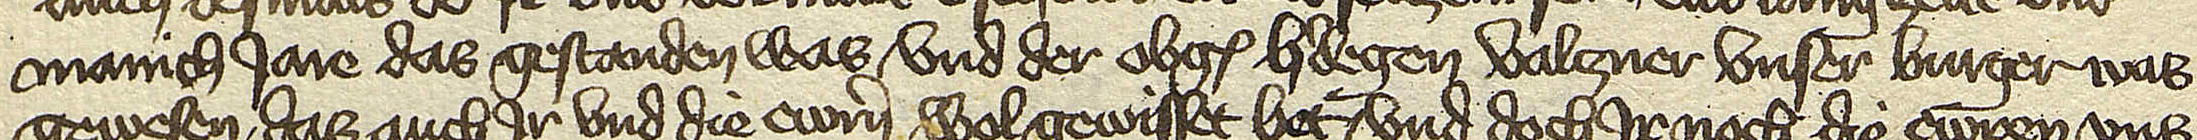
manich Iare das geſtanden was / vnd der obg* h*degen Valcʒner vnſer burger was
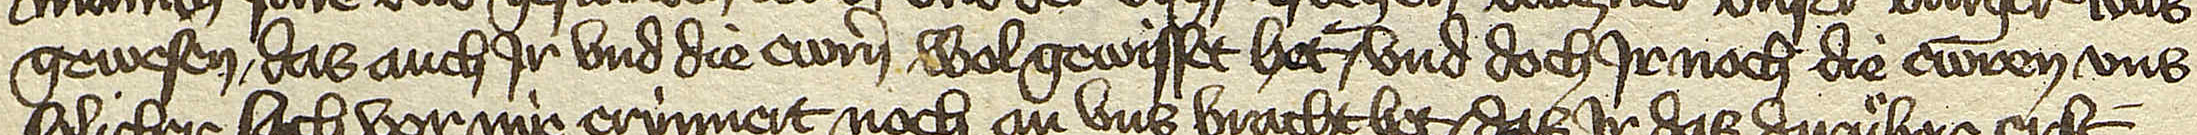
geweſen / das auch Ir vnd die ewm* wol gewiſſet het / vnd doch Ir noch die ewren* vns
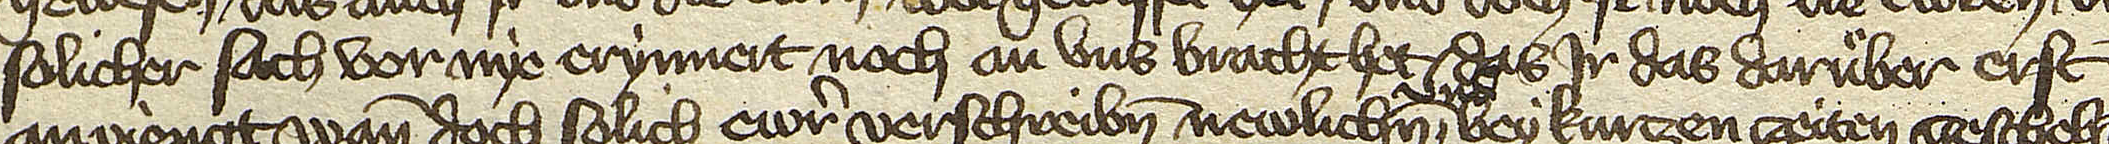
ſolicher ſach vor nye erynnert noch an vns bracht het / das Ir das darüber erſt
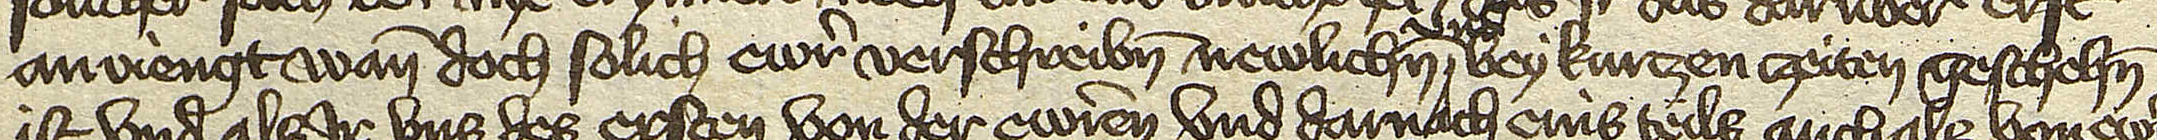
anviengt wan* doch ſolich ewr* verſchreibn* newlichn* bey kurcʒen cʒeiten geſchehn*
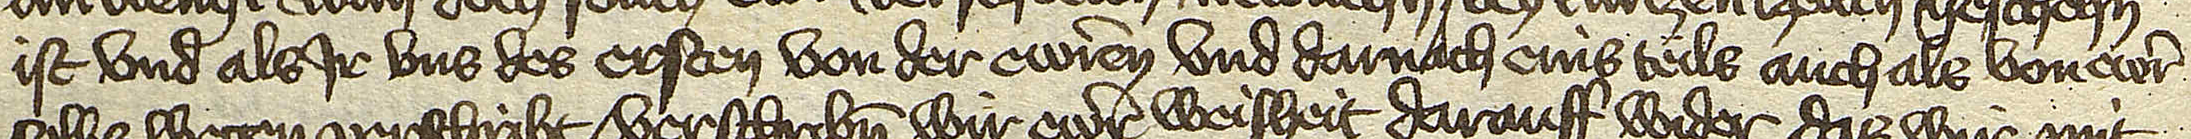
iſt vnd als Ir vns des erſten von der ewren* vnd darnach eins beds auch als von ewr*
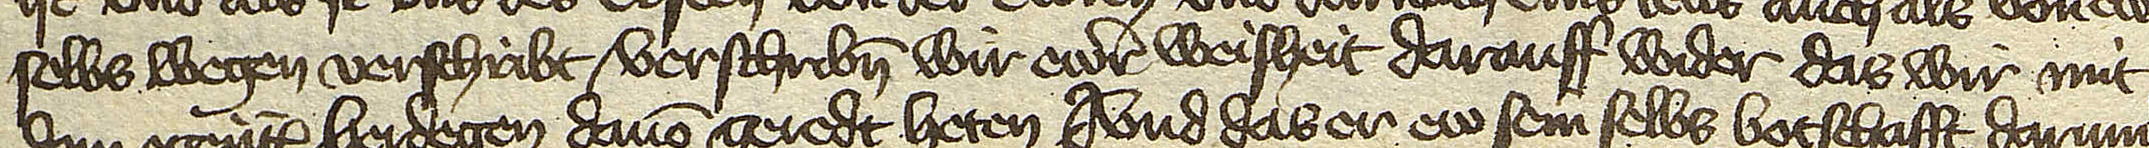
ſelbs wegen verſchribt / verſchribn* wir ewr* weiſheit darauff wider das wir mit
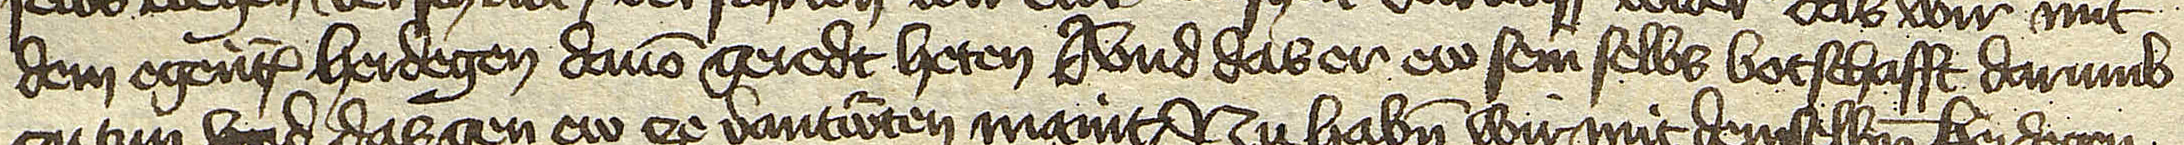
dem egen*t* herdegen dauo* geredt heten / vnd das er ew ſein ſelbs botſchafft darumb
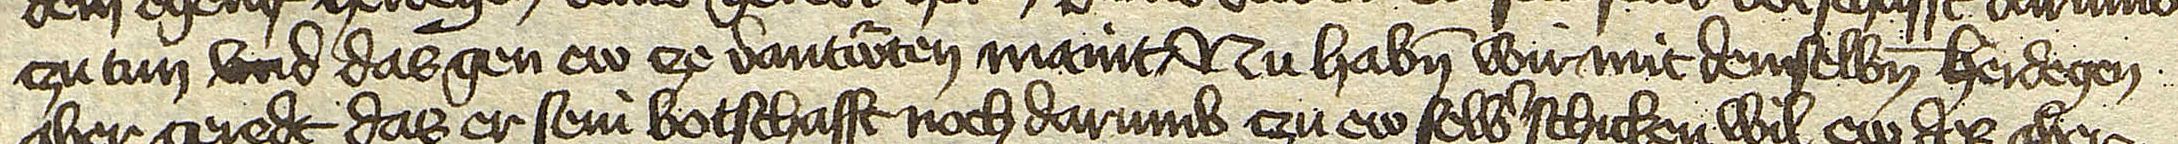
cʒu tun vnd das gen ew cʒe v*antw*ten maint / Nu habn* wir mit demſelbn* herdegen
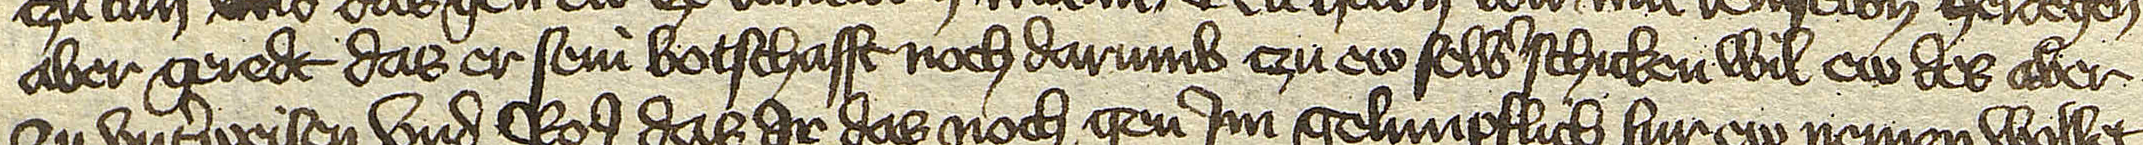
aber geredt das er ſein botſchafft noch darumb cʒu ew ſelb* ſchicken wil ew des aber
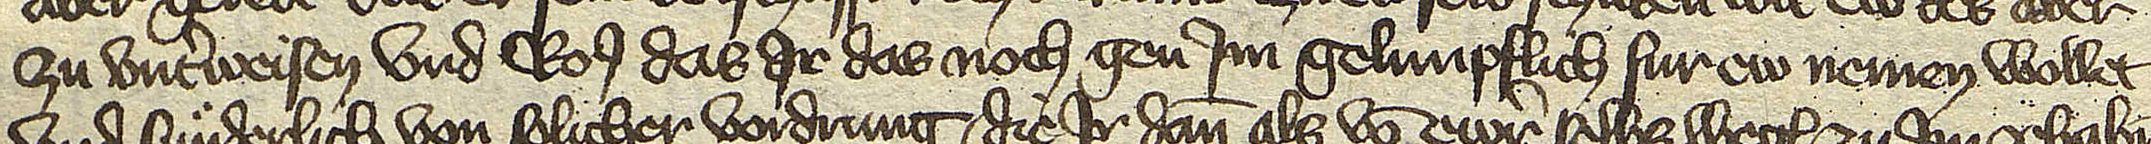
cʒu vnt*weiſen vnd Ro* das Ir das noch gen Im gelimpflich fur ew nemen wollet
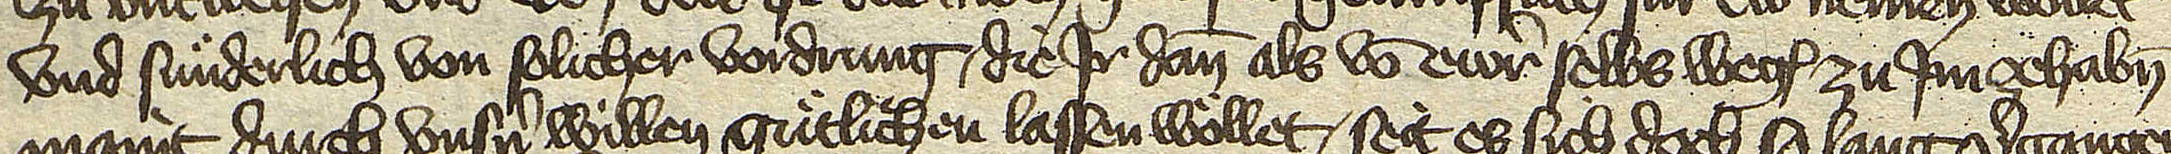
vnd ſünderlich von ſolicher vordrung / die Ir dan* als vo* ewr* ſelbs weg* ʒu Im ʒehabn*
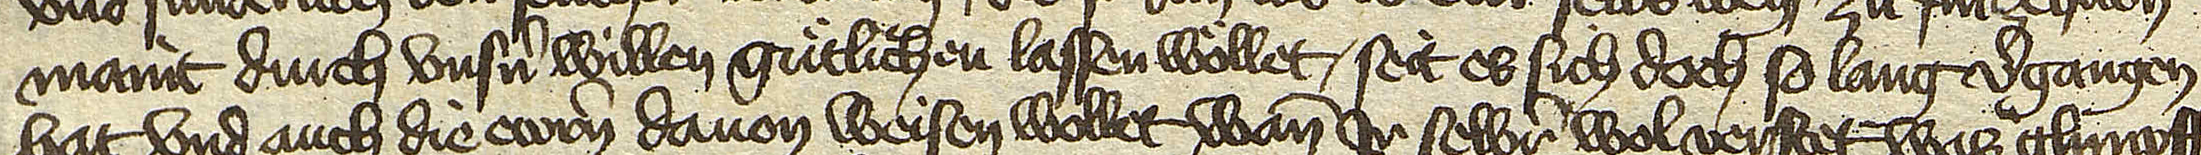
maint durch vnſn* willen gütlichen laſſen wöllet / ſeit es ſich doch ſo lang v*gangen
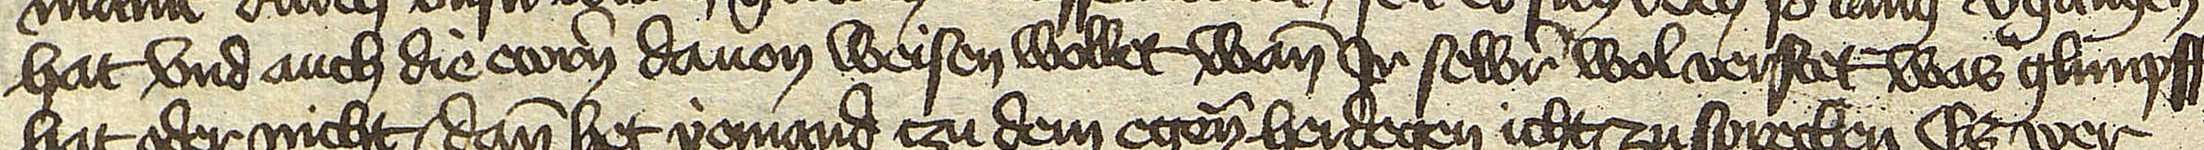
hat vnd auch die ewrn* dauon weiſen wollet wan* Ir ſelbr* wol verſteet was glimpff
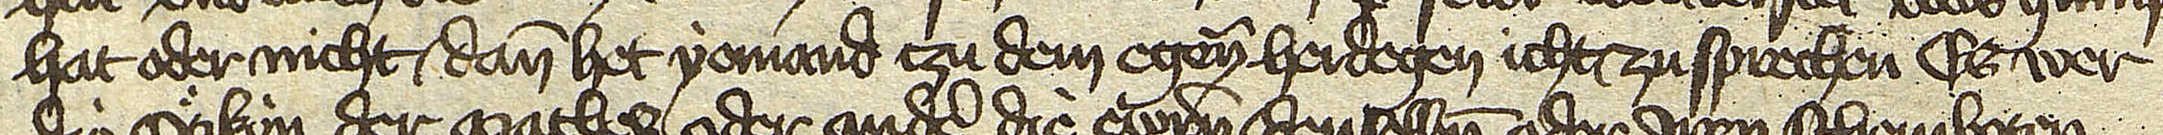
hat oder nicht / dan* het yemand cʒu dem egen* herdegen icht cʒuſprechen Es wer
